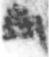○（旆）
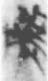雘
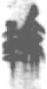輪
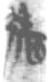弼
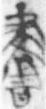畫
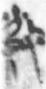○（紛）
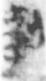韌
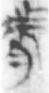○（虎）
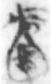○（韔）
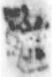○（貘）
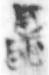聶（攝）
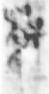○（豻）
